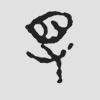𠭁
